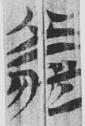義
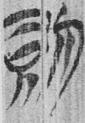則
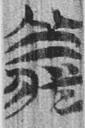義
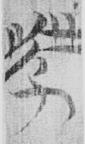○（勝）
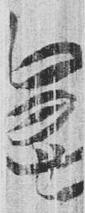怠
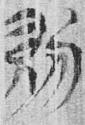則
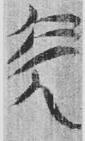長
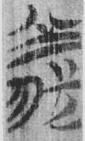義
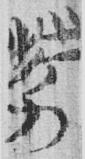○（勝）
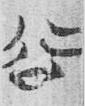谷（欲）
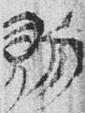則
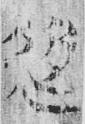從
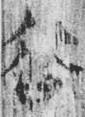谷（欲）
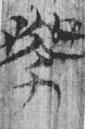○（勝）
